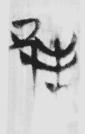邦
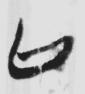㠯（以）
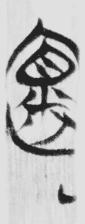褱
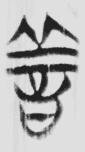善
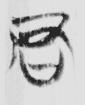君
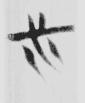必
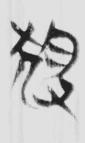{犬肉又}
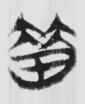昔
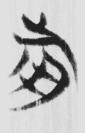歬
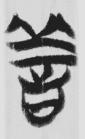善
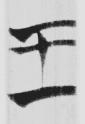王
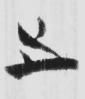之
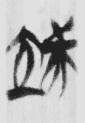{立廌}
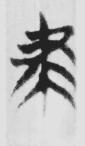聿
